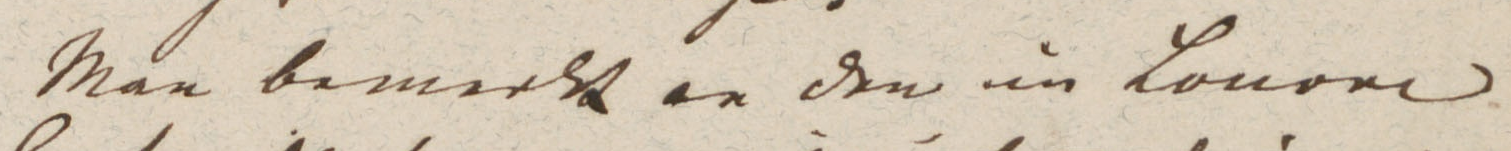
Man bemerkt an den im Louvre
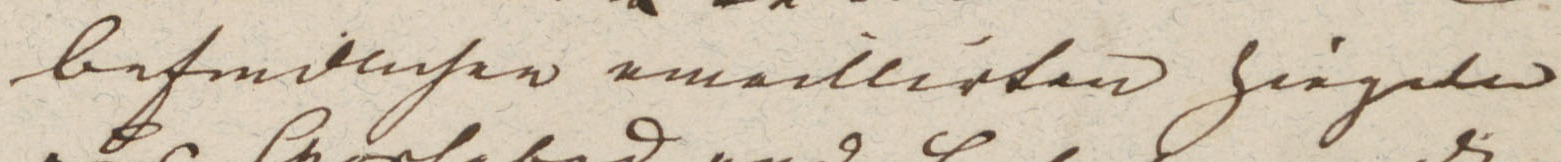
befindlichen emaillirten Ziegeln
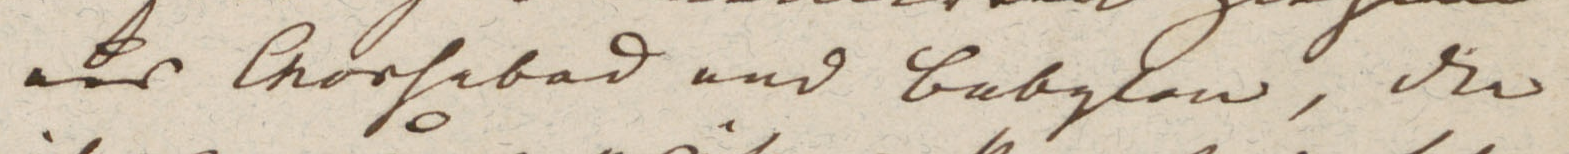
aus Chorsabad und Babylon, die
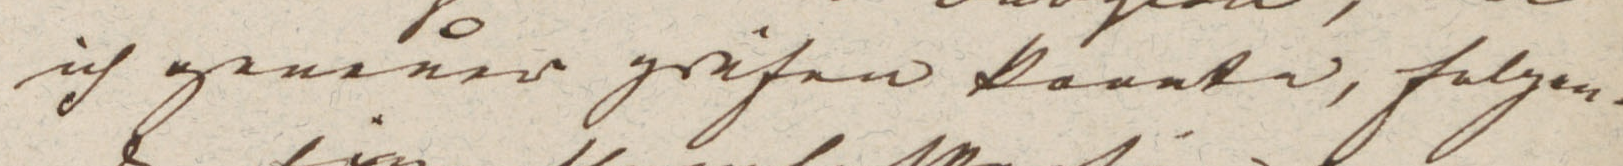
ich genauer greifen konnte, folgen-
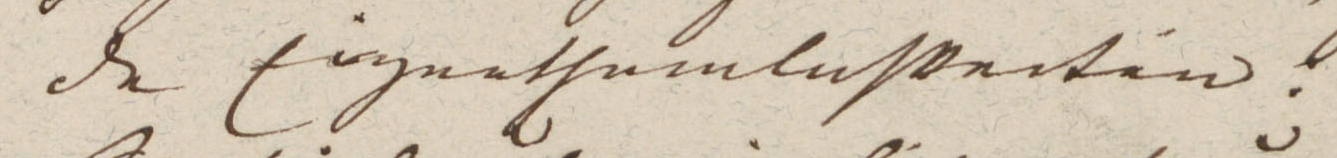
de Eigenthumlichkeiten:
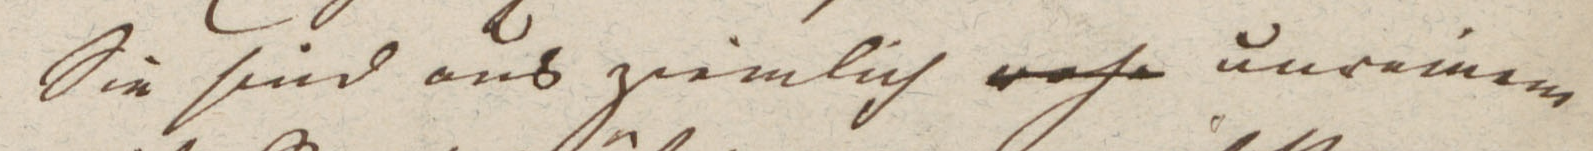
Sie sind aus ziemlich rohe unreinem
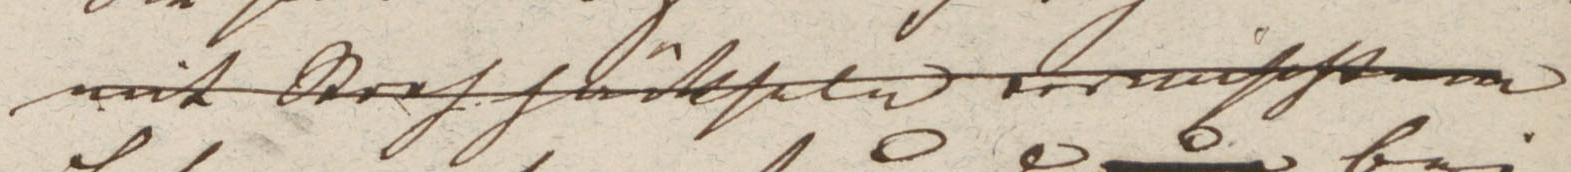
mit Strohhäckseln vermischtem
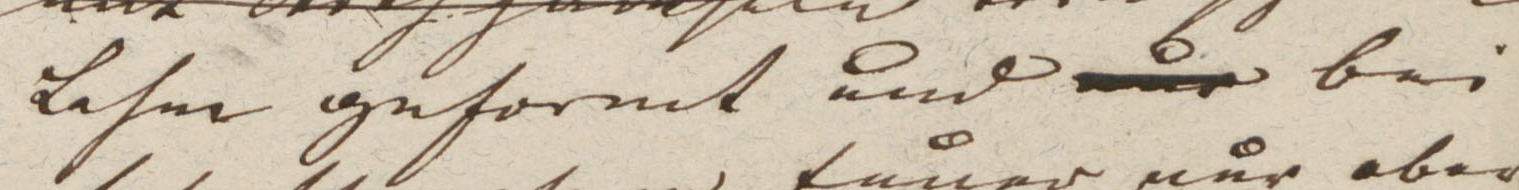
Lehm geformt und nur bei
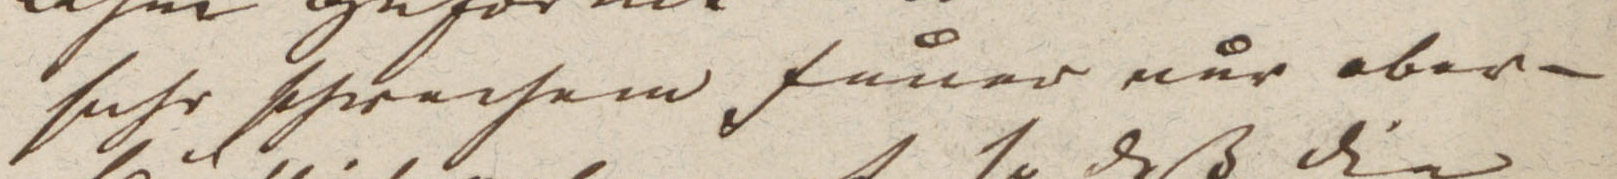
sehr schwachem Feuer nur ober-
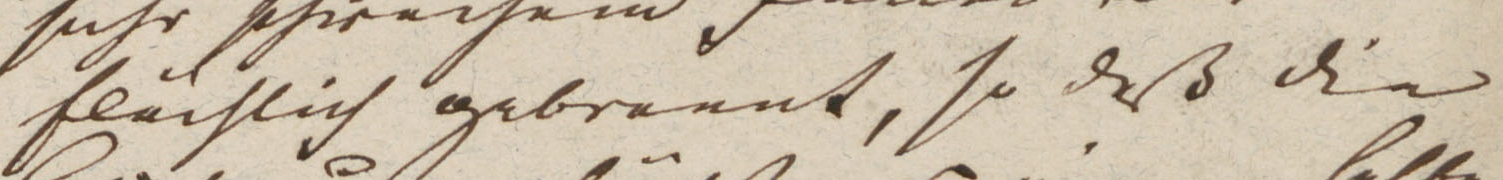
flächlich gebrannt, so dass die
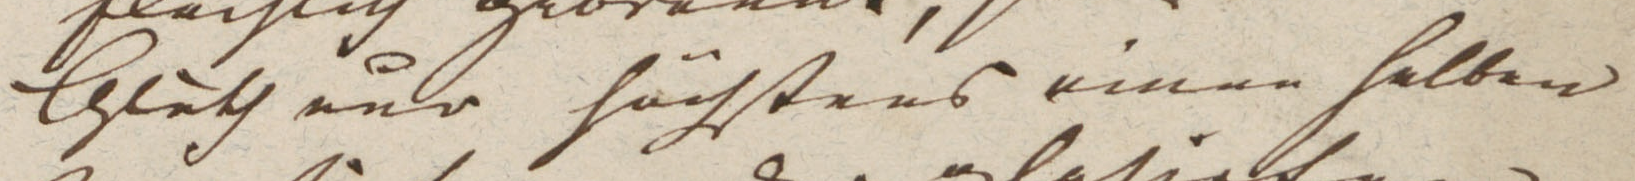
Gluth nur höchstens einen halben
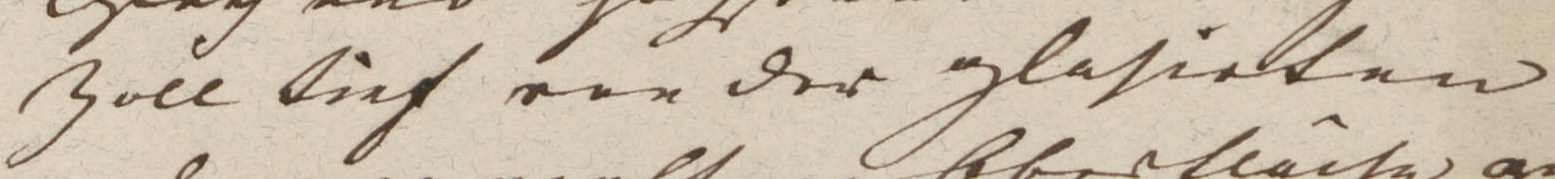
Zoll tief von der glasirten
